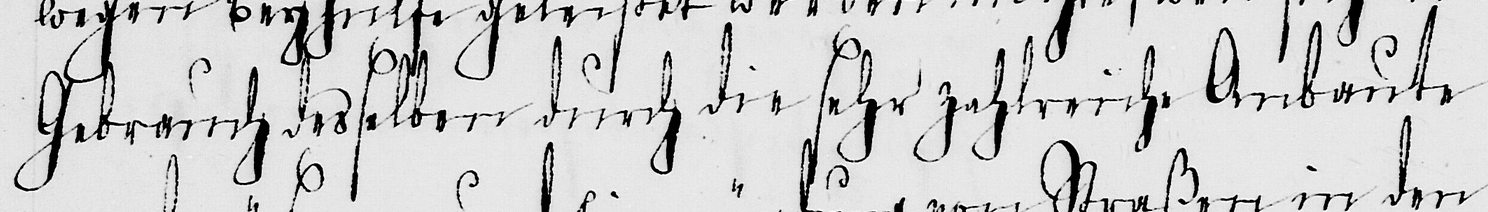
Gebrauch desselben durch die sehr zahlreiche Ausbaute
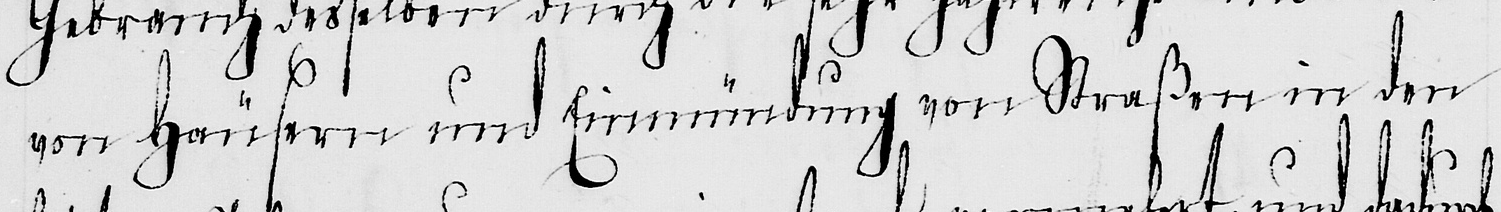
von Häusern und Einmündung von Straßen in den
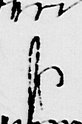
l¬
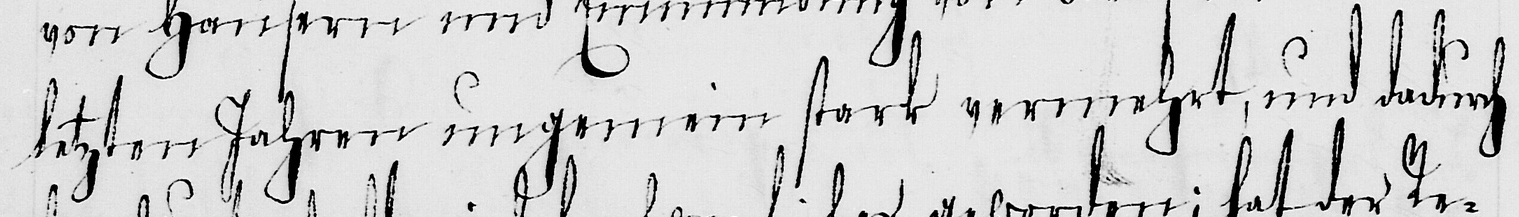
letzten Jahren ungemein stark vermehrt, und dadurch
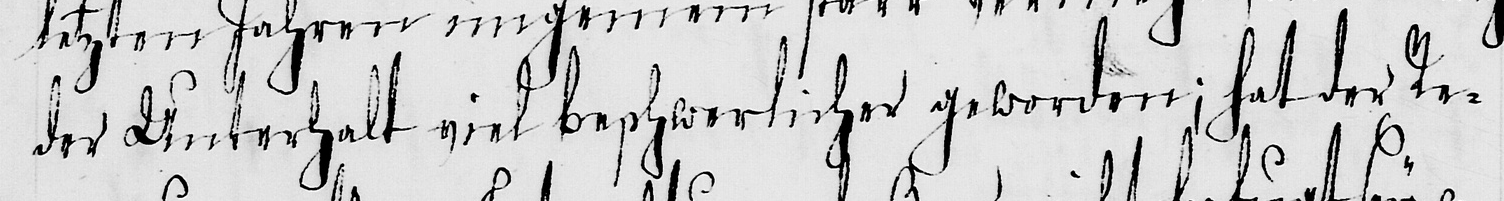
der Unterhalt viel beschwerlicher geworden; hat der Re¬
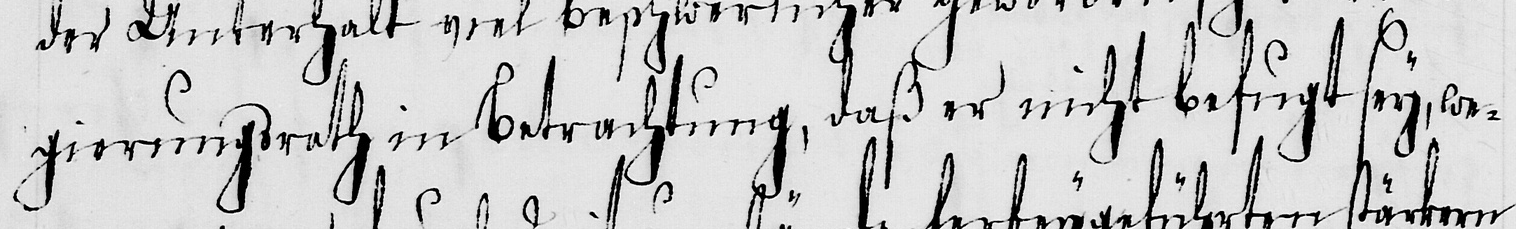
gierungsrath in Betrachtung, daß er nicht befugt sey, we¬
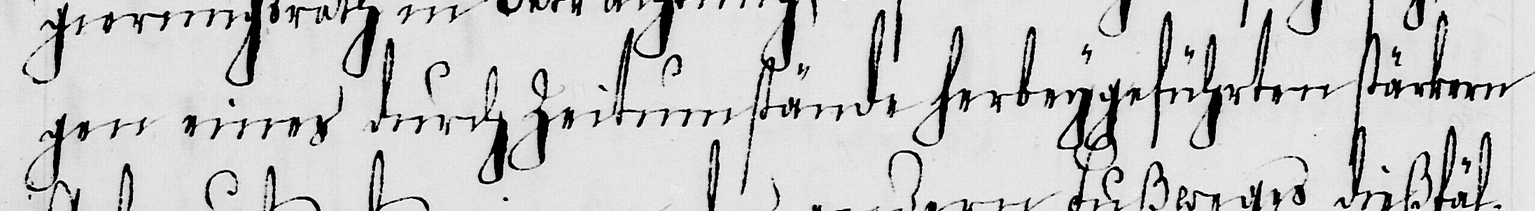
gen eines durch Zeitumstände herbeygeführten stärkern
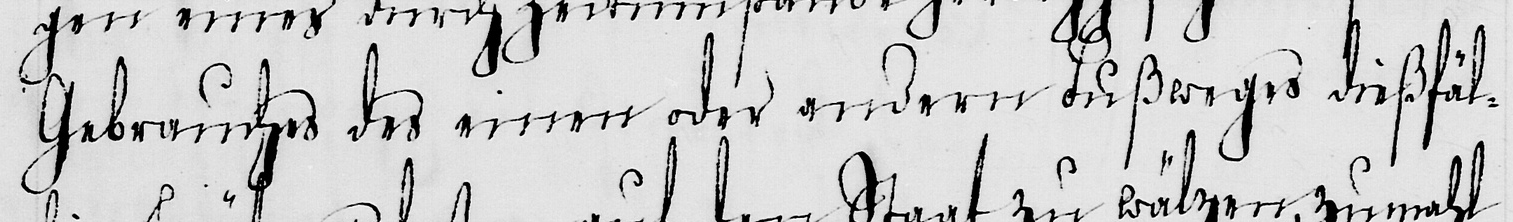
Gebrauches des einen oder andern Fußweges dießfäl¬
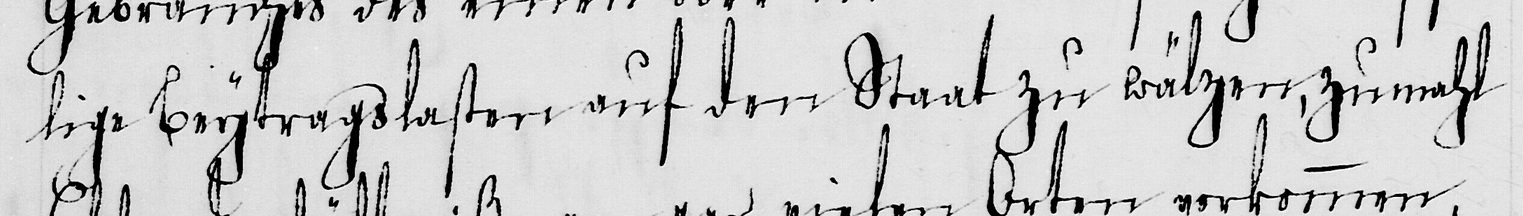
lige Beytragslasten auf den Staat zu wälzen, zumahl
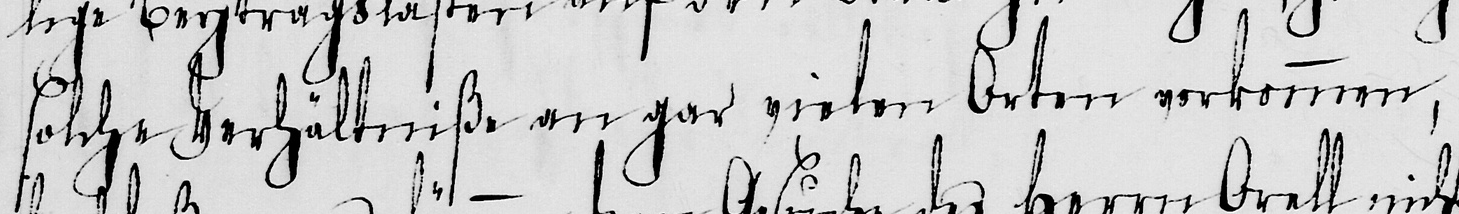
solche Verhältniße an gar vielen Orten vorkommen,
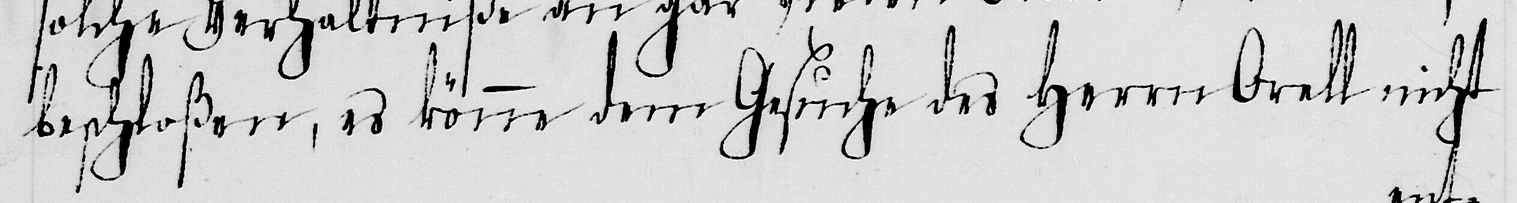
beschloßen, es könne dem Gesuche des Herrn Orell nicht
